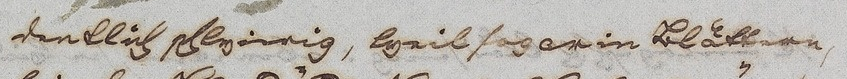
dentlich schwierig, weil sogar in Blättern,
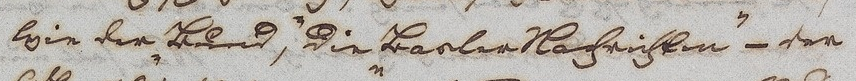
wie der «Bund», die «Basler Nachrichten» – der
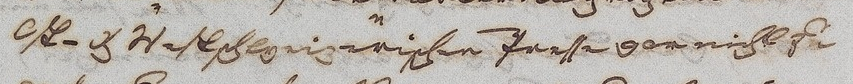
Ost- & Westschweizerischen Presse gar nicht zu
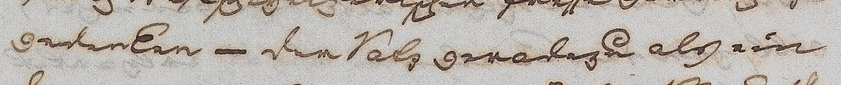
gedenken – der Satz geradezu als ein
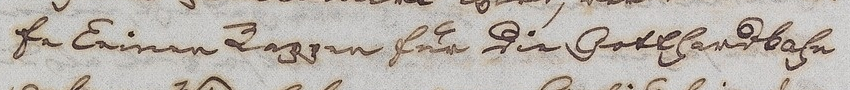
fe keinen Rappen für die Gotthardbahn
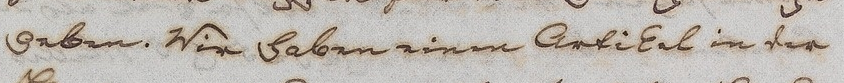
geben. Wir haben einen Artikel in der
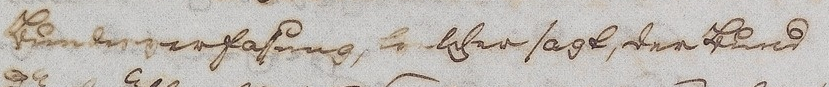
Bundesverfassung, welcher sagt, der Bund
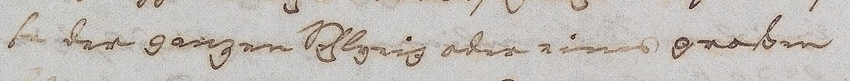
se der ganzen Schweiz oder eines großen
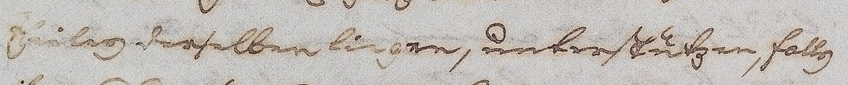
Theiles derselben liegen, unterstützen, falls
